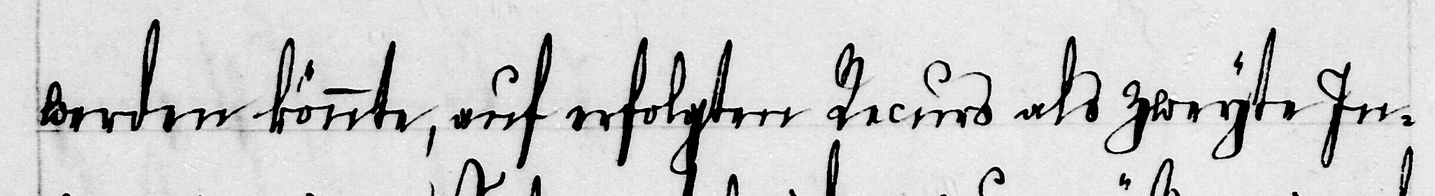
werden könnte, auf erfolgten Recurs als zweyte In¬
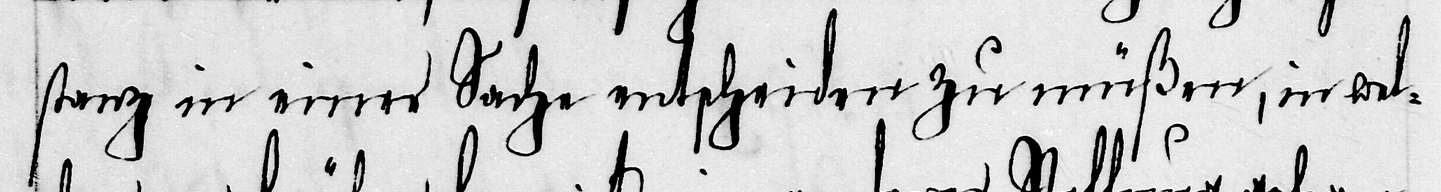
stanz in einer Sache entscheiden zu müßen, in wel¬
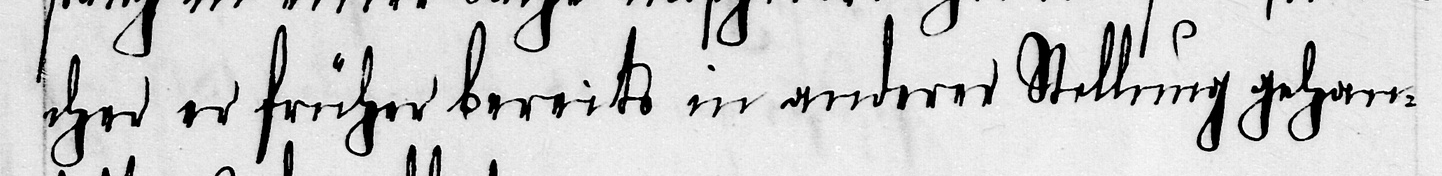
cher er früher bereits in anderer Stellung gehan¬
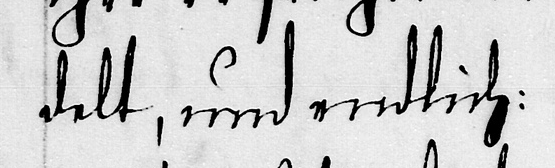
delt, und endlich:
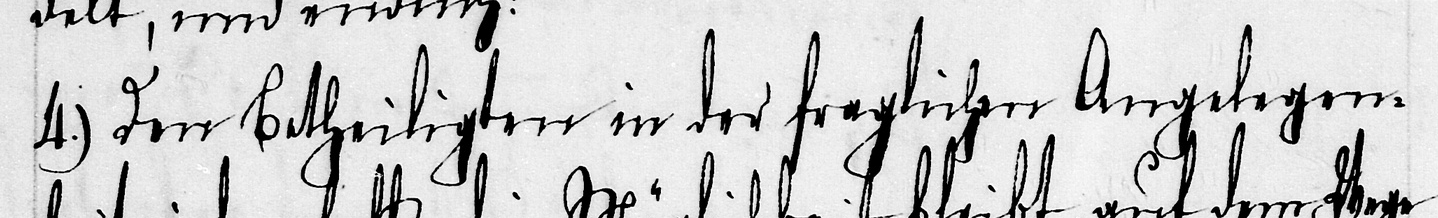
4.) Den Betheiligten in der fraglichen Angelegen¬
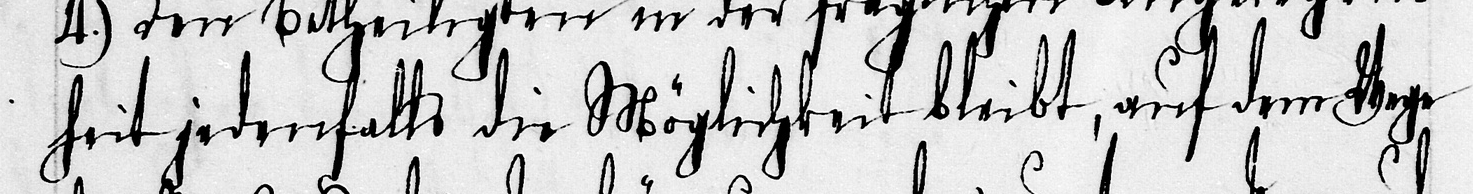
heit jedenfalls die Möglichkeit bleibt, auf dem Wege
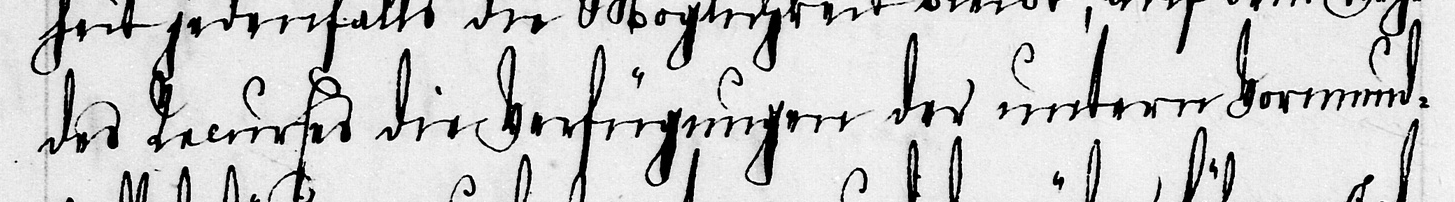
des Recurses die Verfügungen der untern Vormunds¬
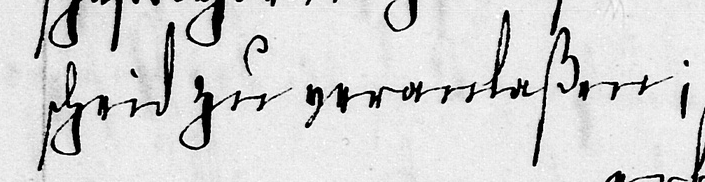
scheid zu veranlaßen;
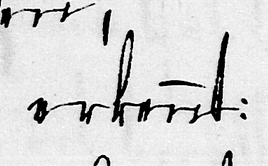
erkennt:
